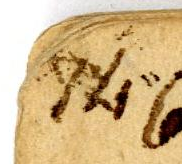74
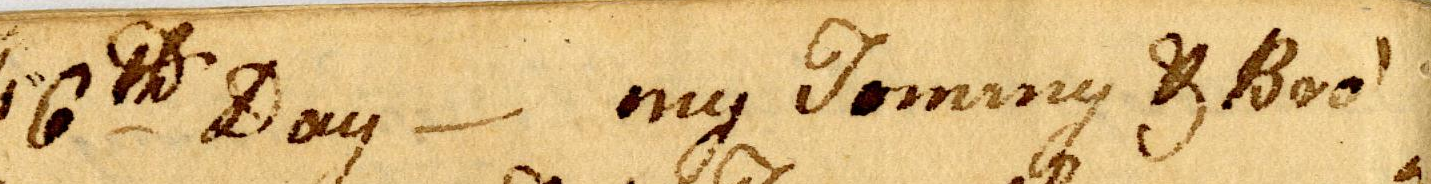6^th Day- my Tomm7 & Bro'
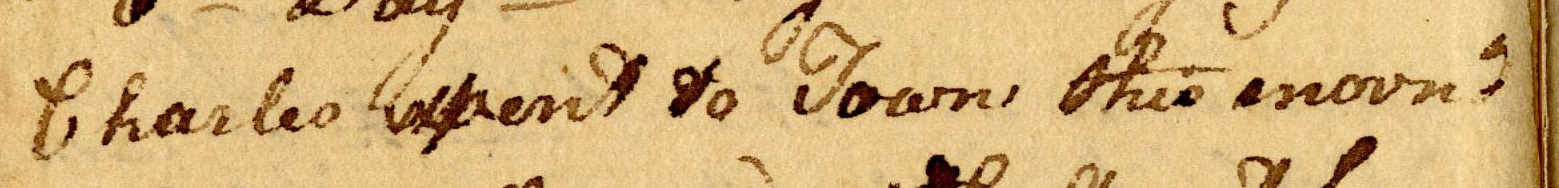Charles spent to Town this morn^g
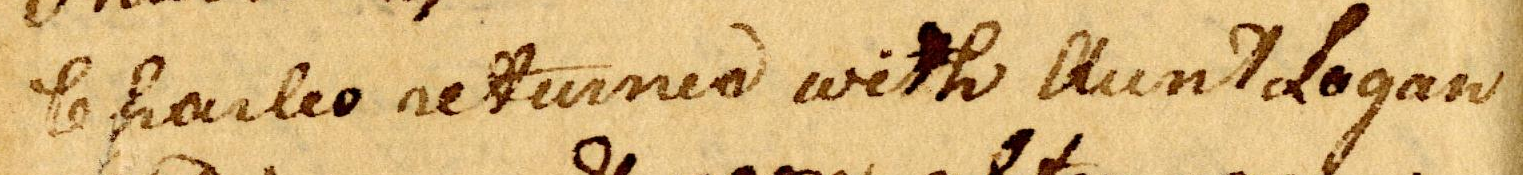Charles returned with Aunt Logan
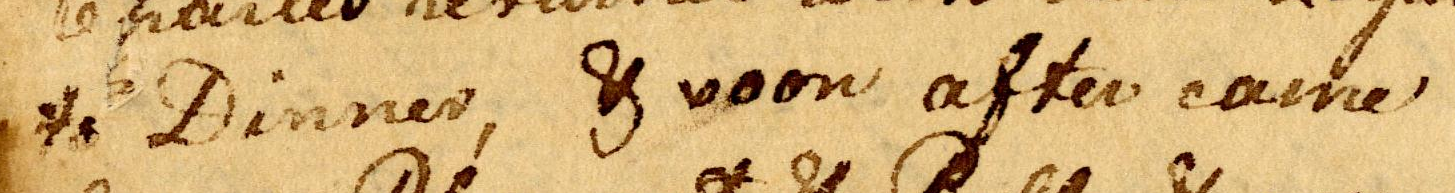to Dinner, & soon after came
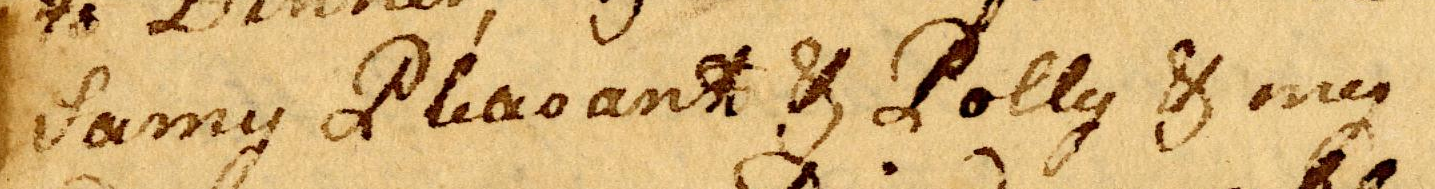Samy Pleasant & Polly & my
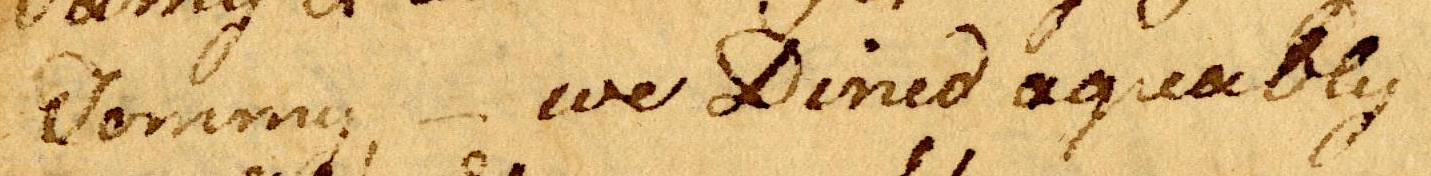Tommy- we Dined agreably
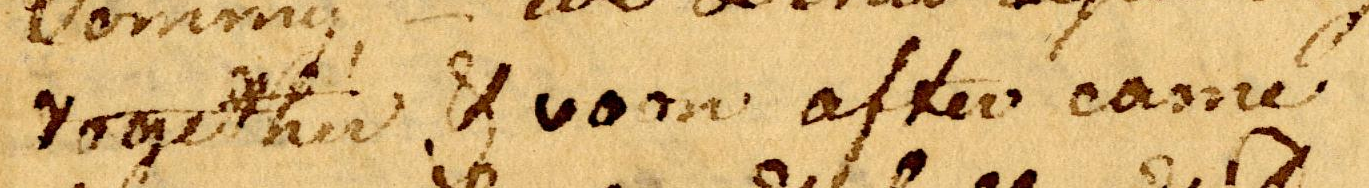together & soon after came
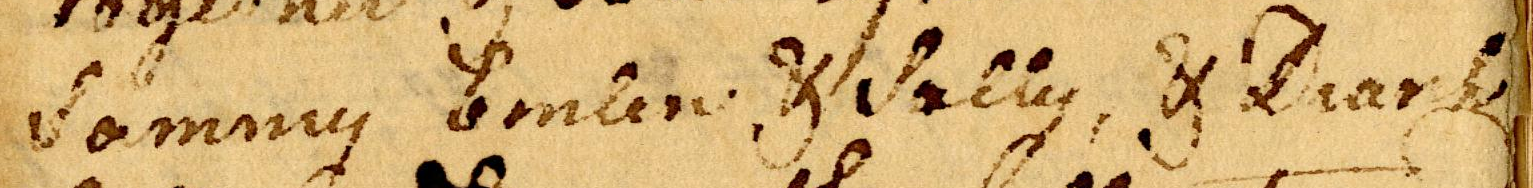Sammy Emlen & Sally, & Drank
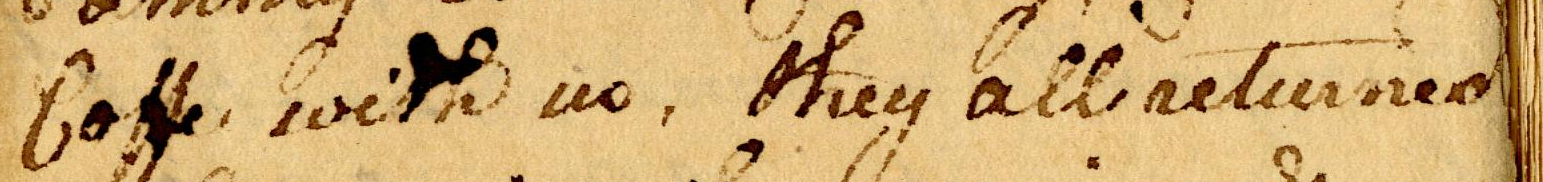Coffe with us, they all returned
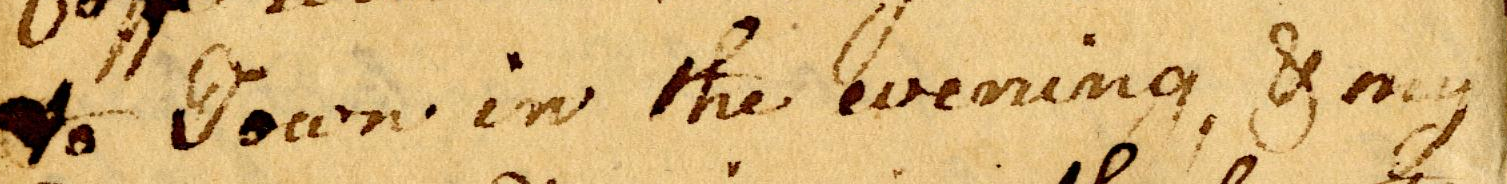to Town in the evening & my
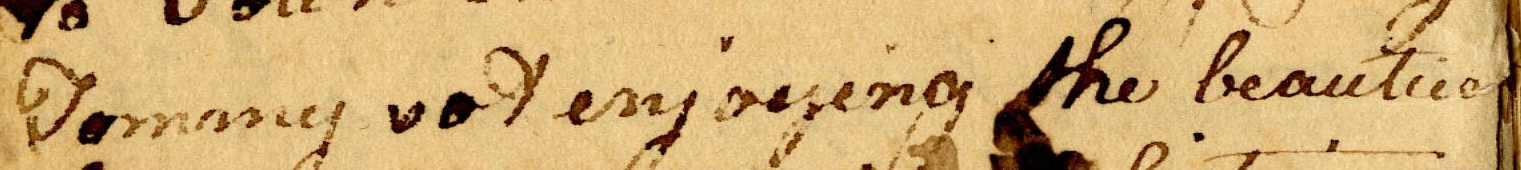Tommy sot enjoying the beauties
